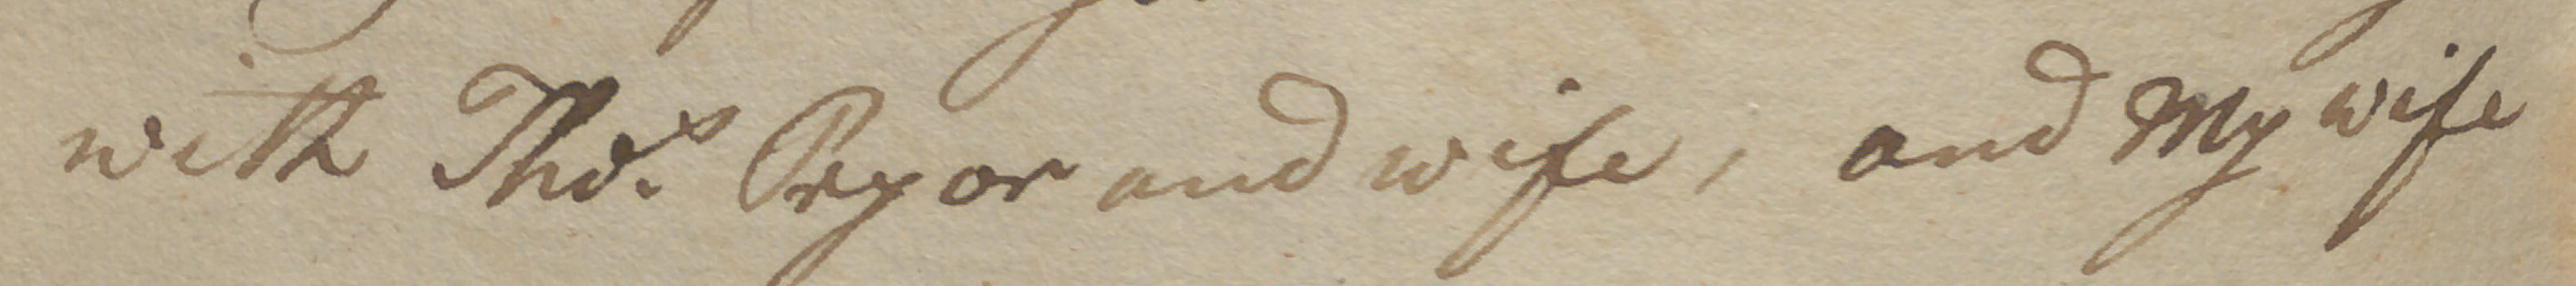with Tho^s. Pryor and wife, and My wife
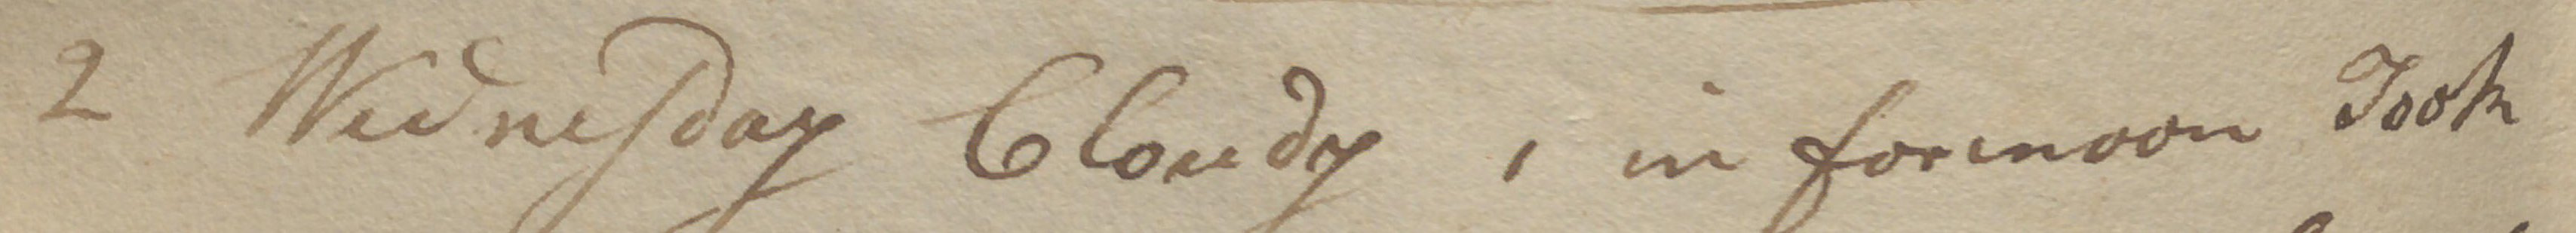2 Wednesday Cloudy, in forenoon Took
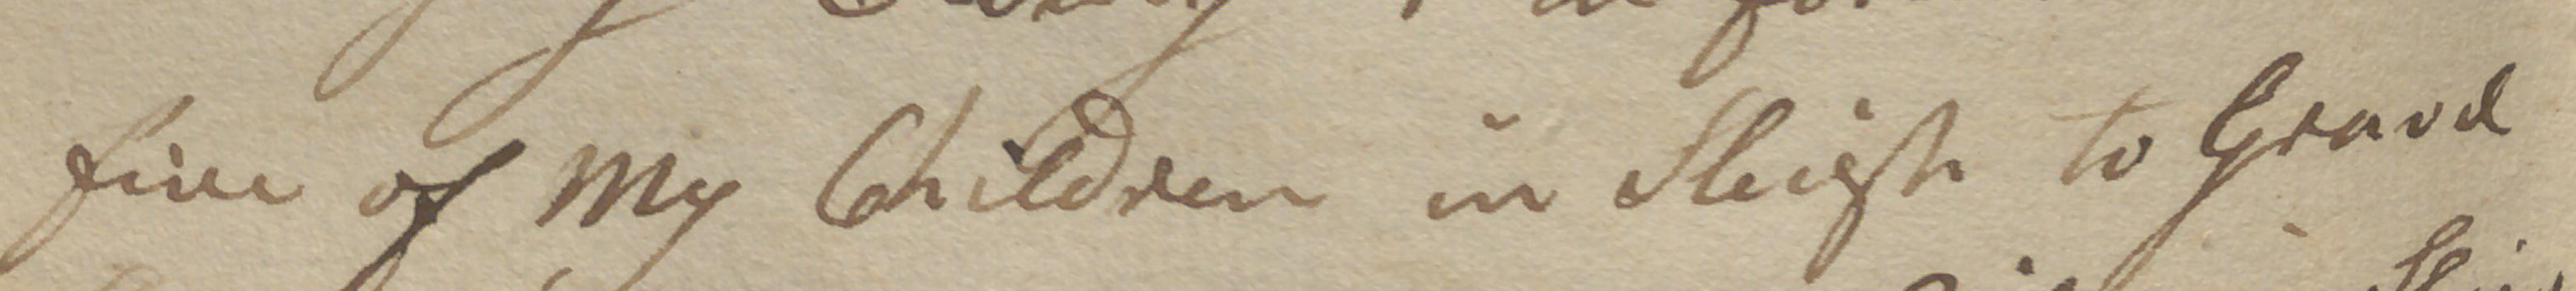five of My Children in Sleigh to Gravel
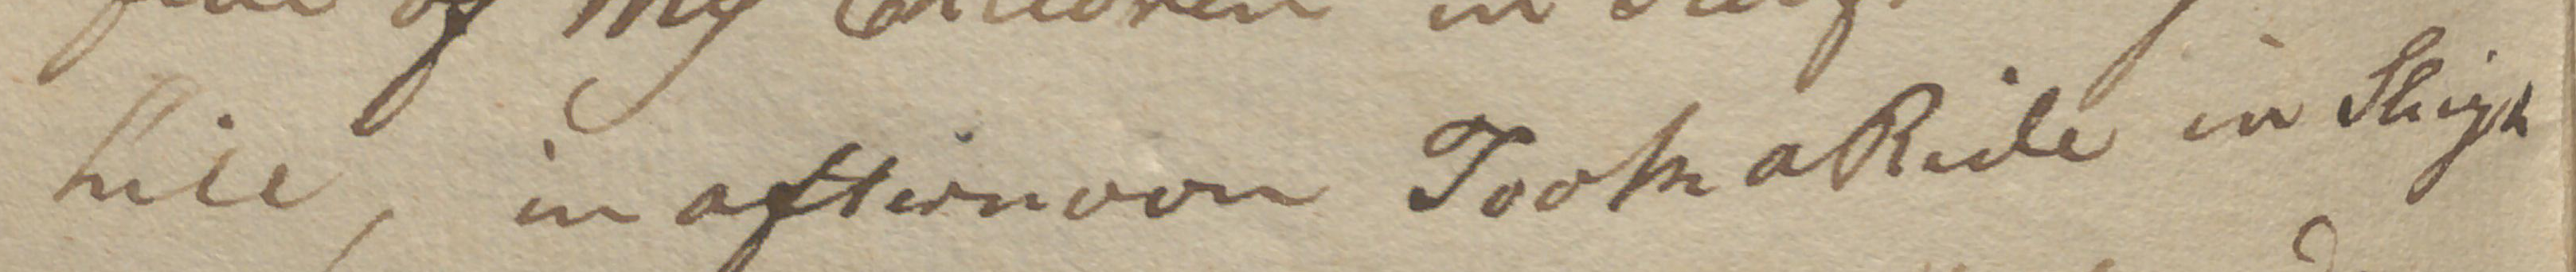hill, in afternoon Took a Ride in Sleigh
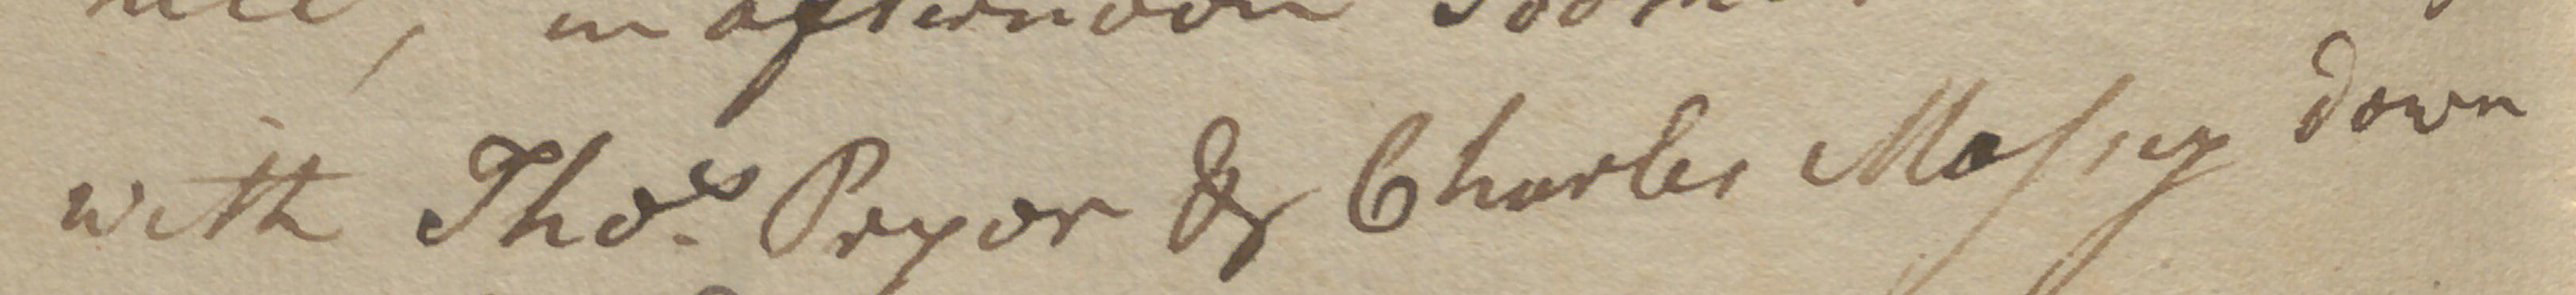with Tho^s. Pryor & Churles Massey down
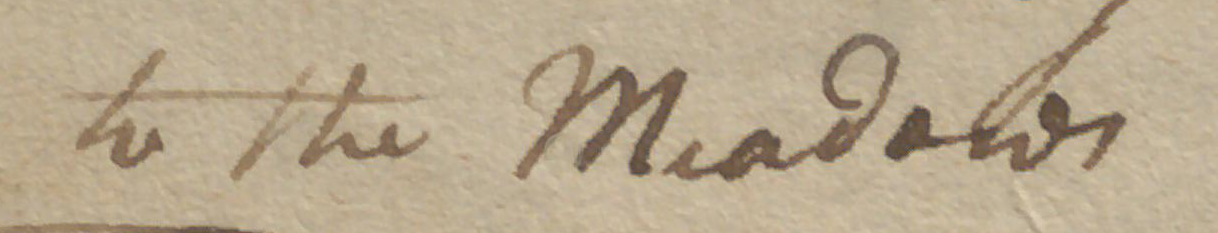to the Meadows
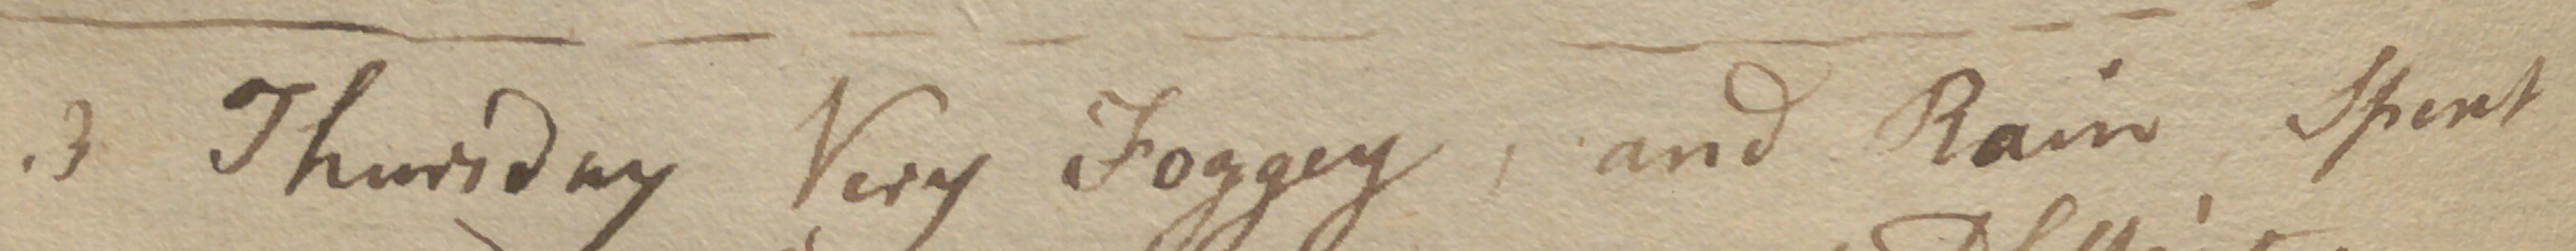3 Thursday Very Foggey, and Rain spent
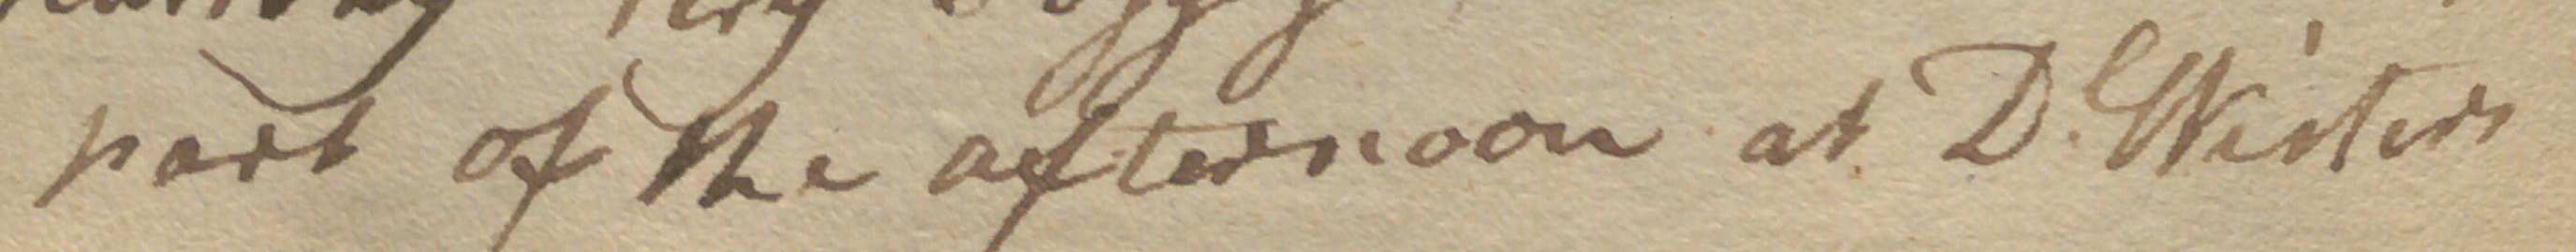part of the afternoon at D^l. Wisters
